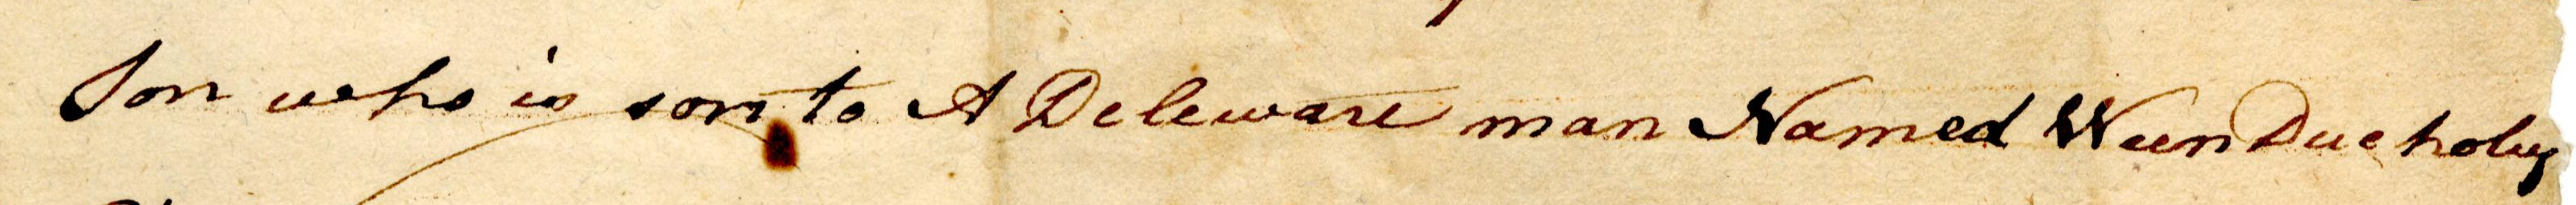Son who is son to A Deleware man Named Ween Ducholy
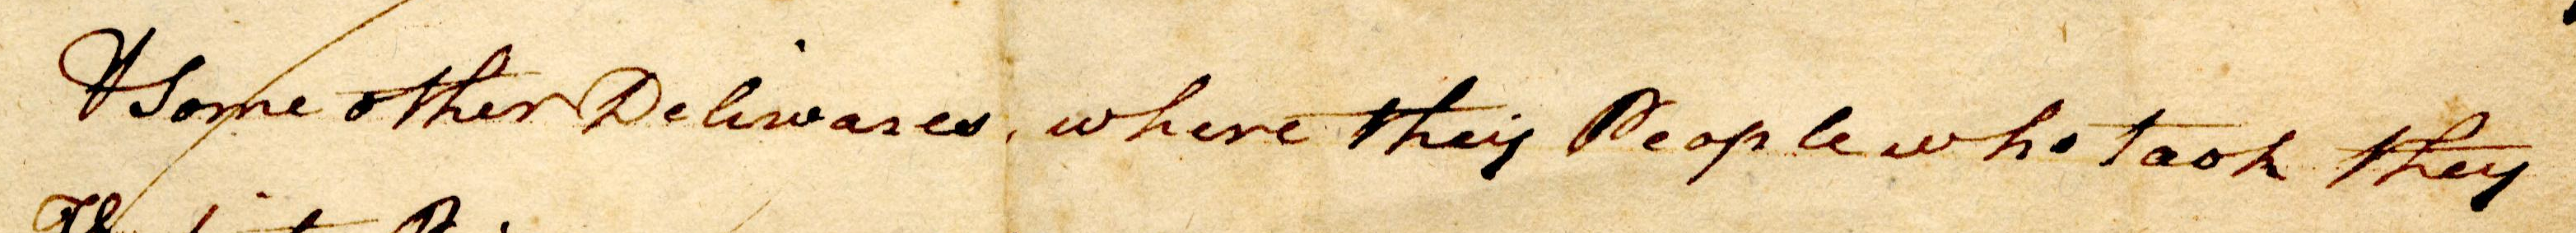& some other Delewares, where they People who took they
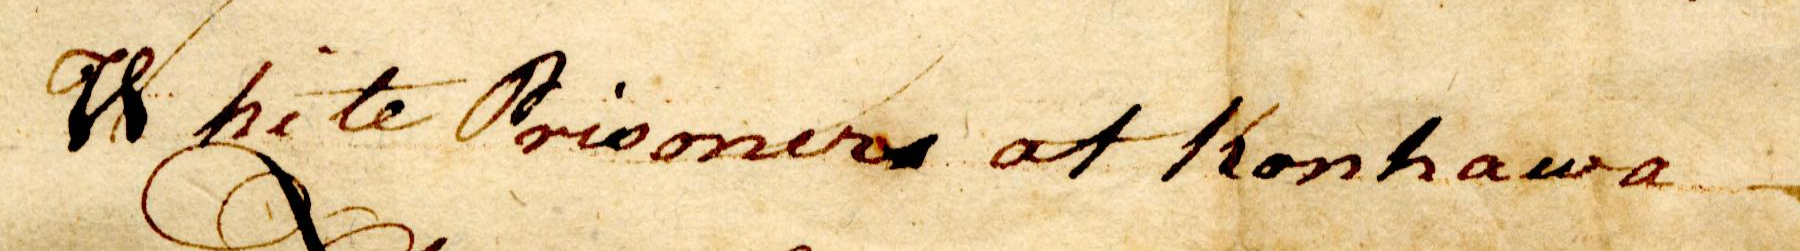White Prisoners at Kanhawa
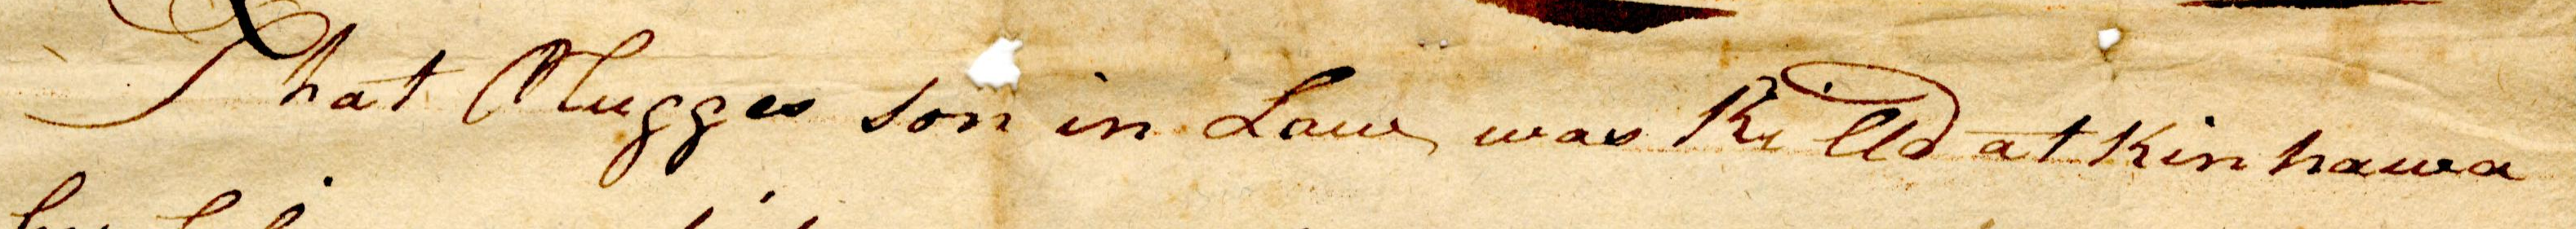That Plugges son in Law was kill'd at Kinhawa
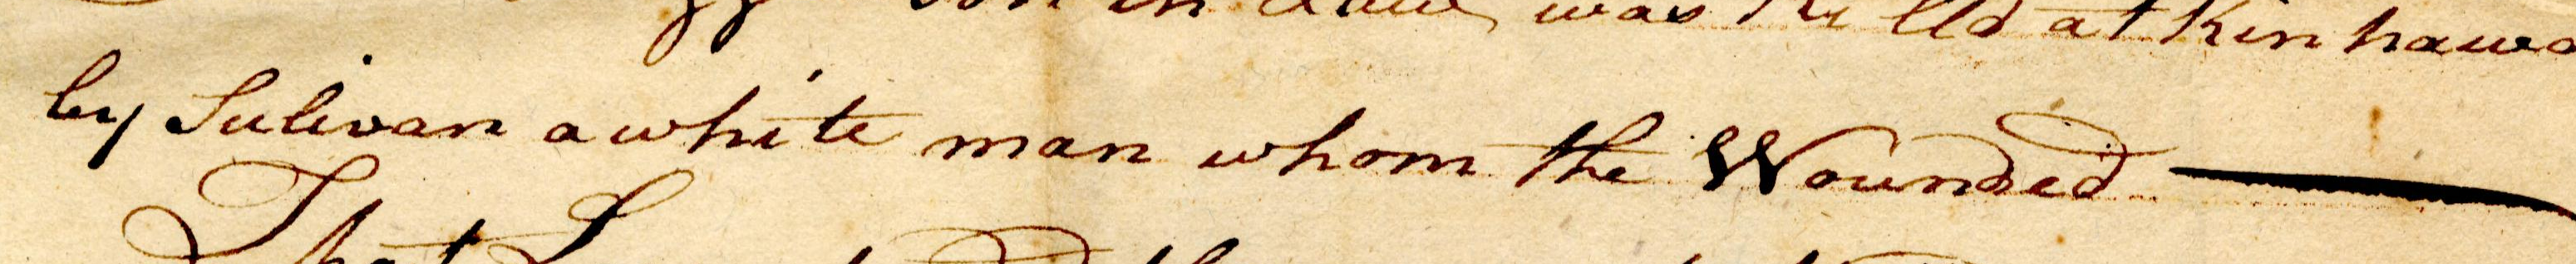by Sulivan a white man whom the Wounded-
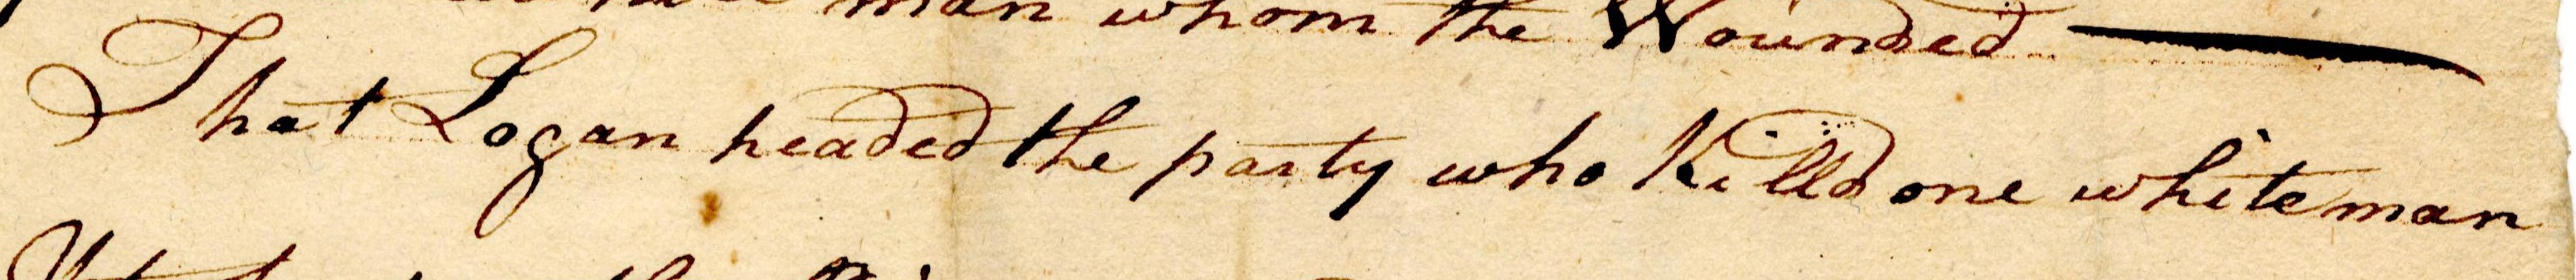That Logan headed the party who Kill'd one whiteman
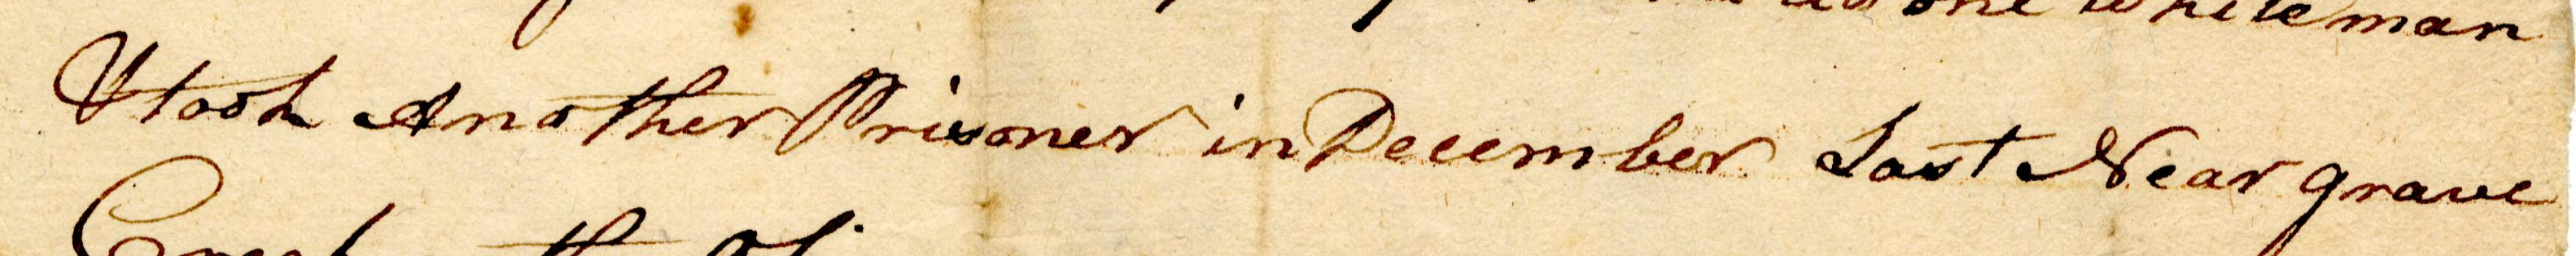& took Another Prisoner in December Last Near grave
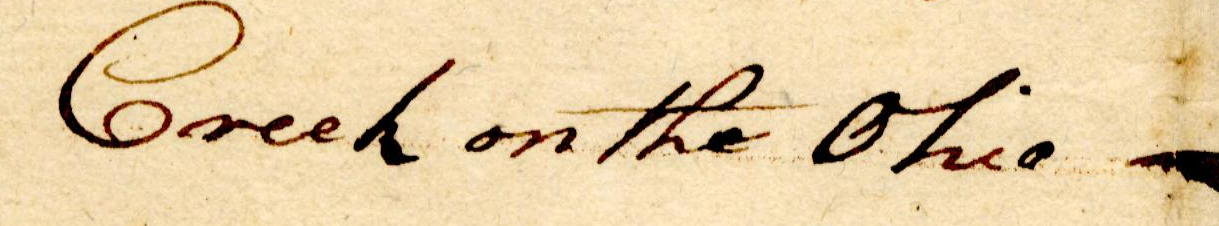Creek on the Ohio-
